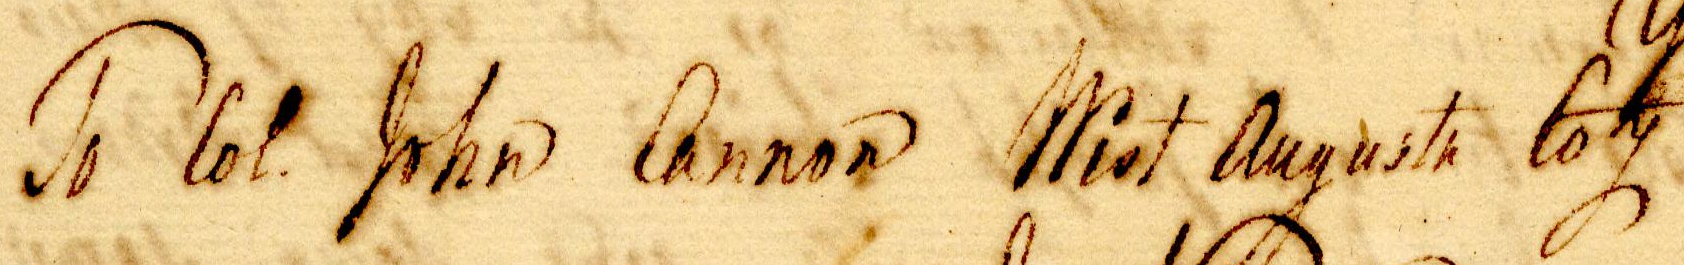To Col. John Cannon West Augusta Co^y
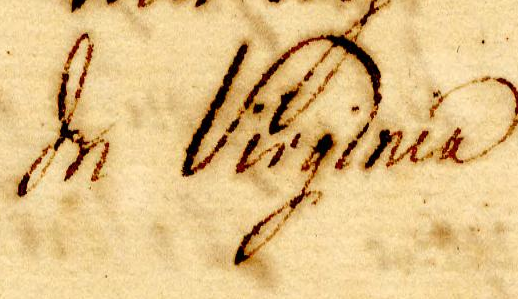In Virginia
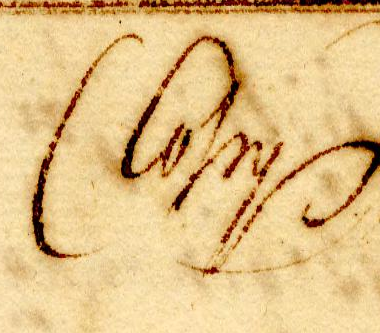(Copy)
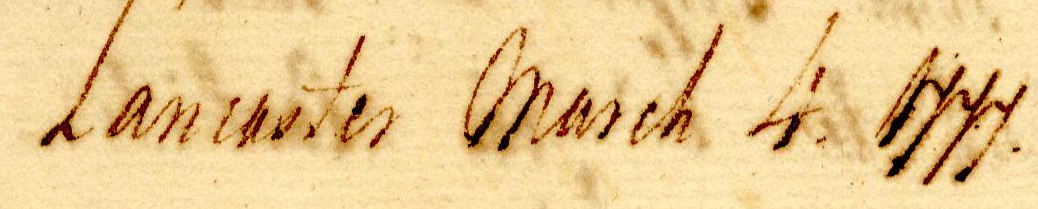Lancaster March 4 1777.
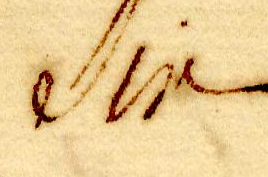Sir
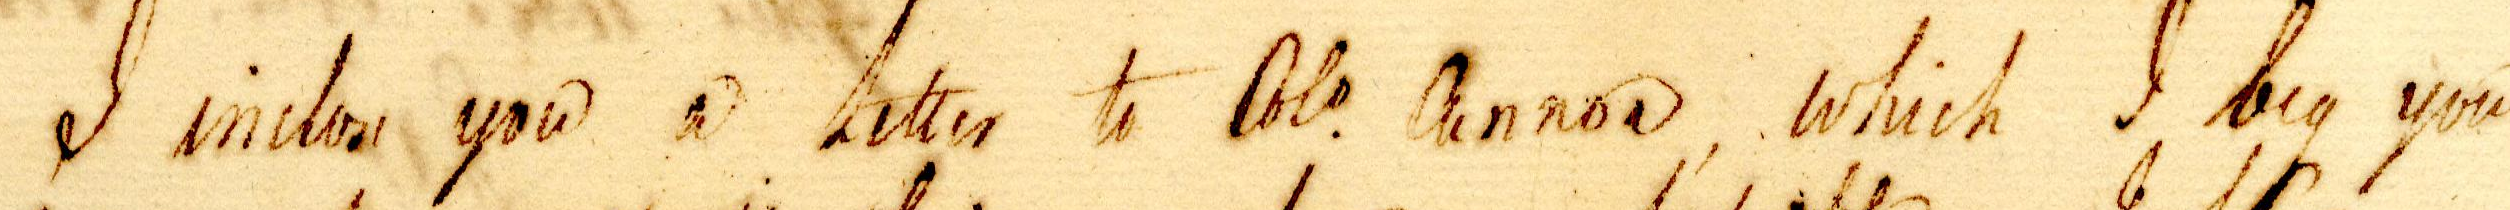I inclose you a Letter to Colo. Cannon, which I beg you
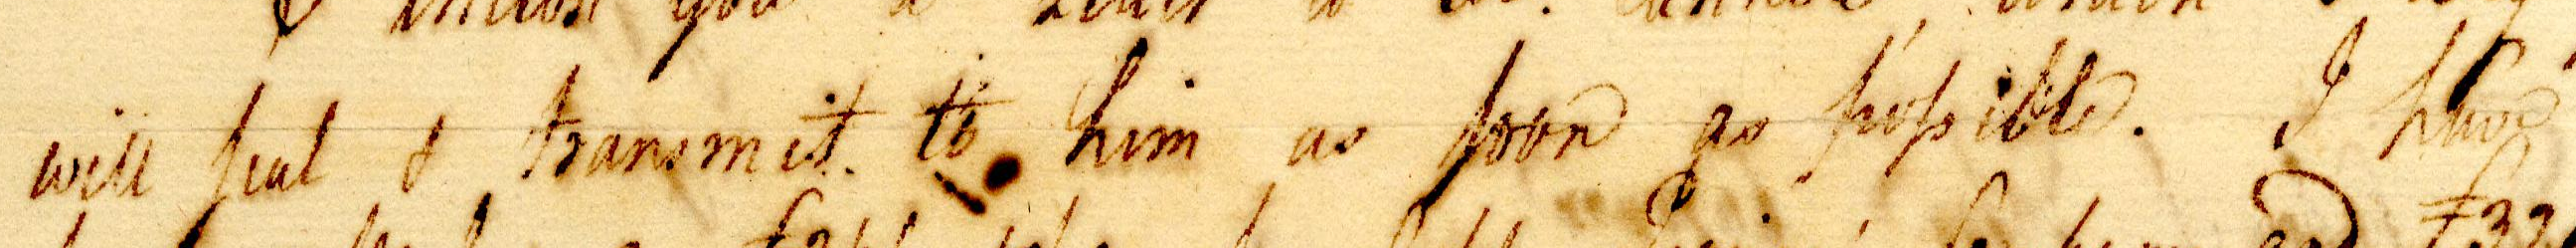will seal & transmit to him as soon as possible. I have
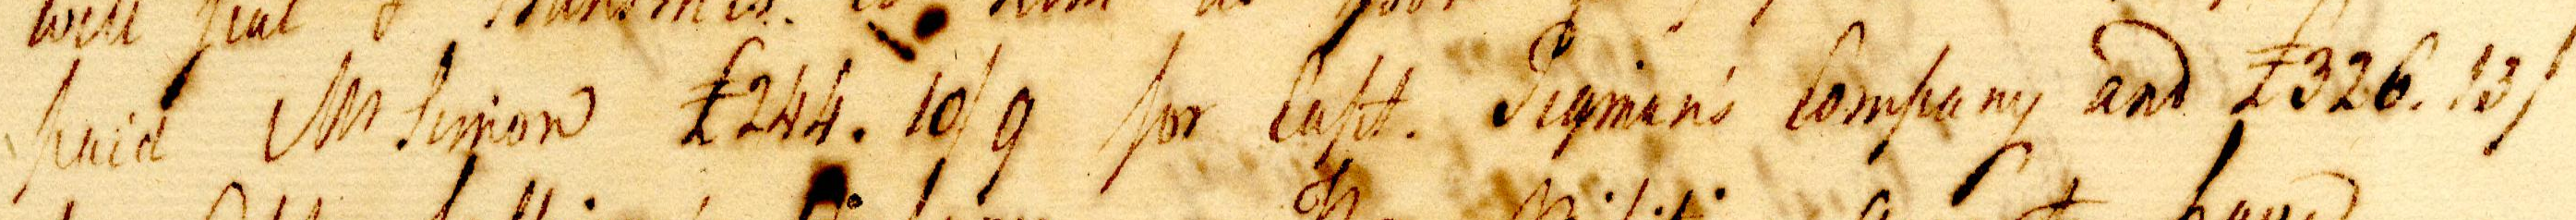paid M^r Simon £244.10s9 for Capt. Pegman's Company and £326.13s
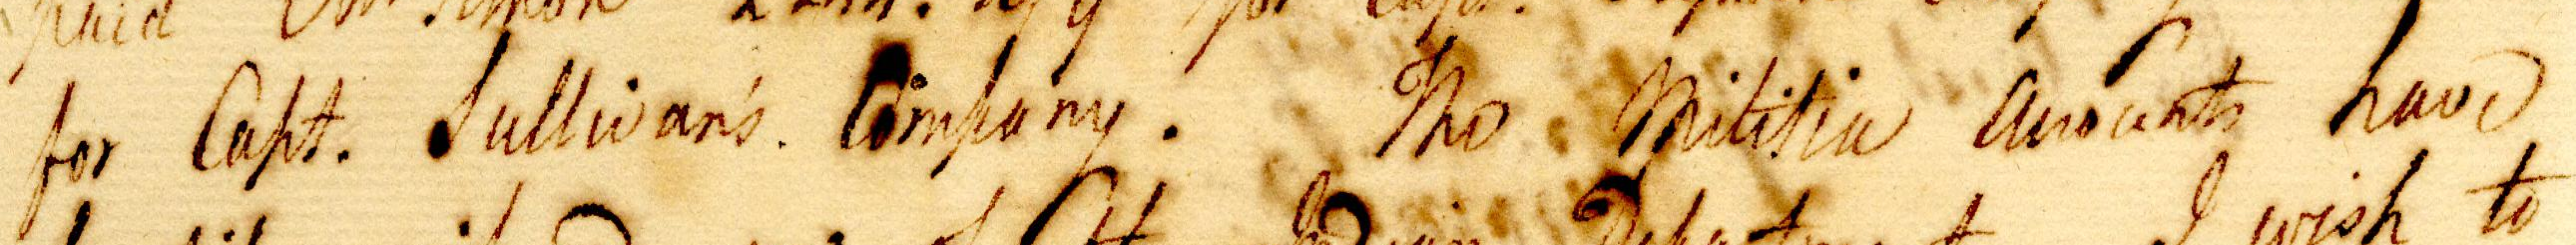for Capt. Sullivan's Company. The Militia Accounts have
